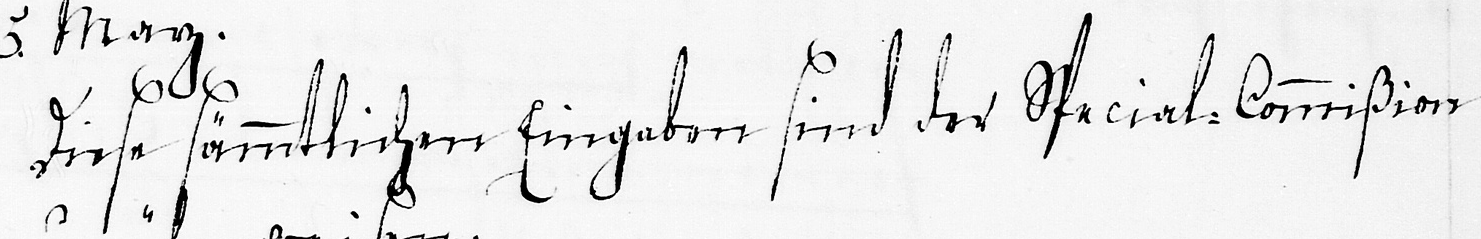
Diese sämmtlichen Eingaben sind der Special-Commißion
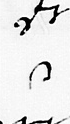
d.
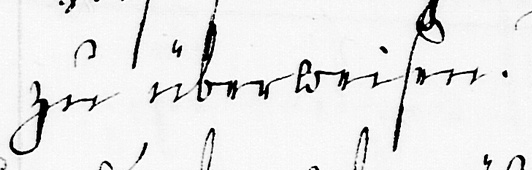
zu überweisen.
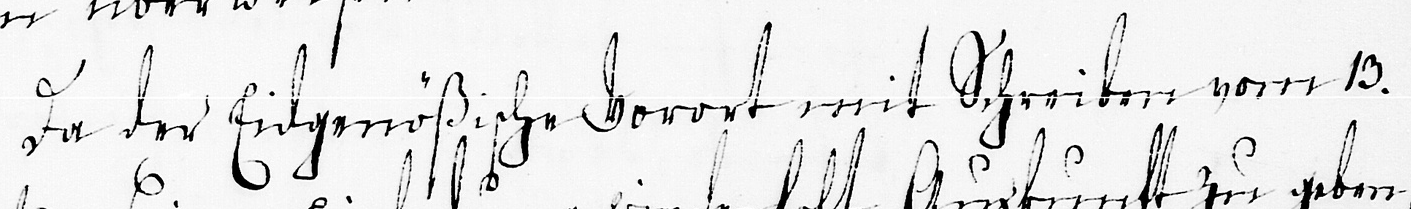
Da der Eidgenößische Vorort mit Schreiben vom 13.
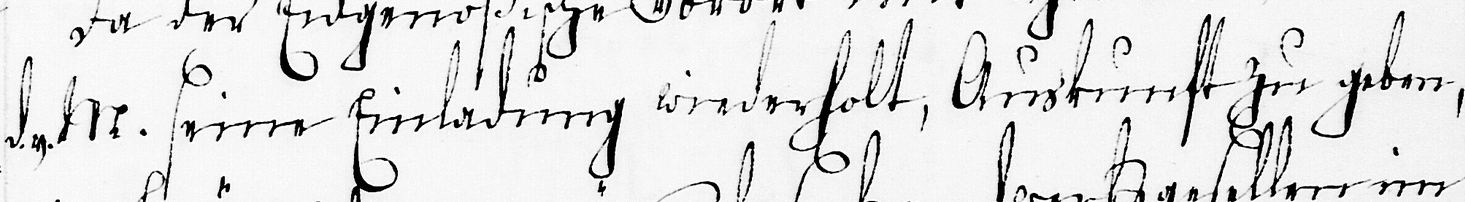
v. M. seine Einladung wiederholt, Auskunft zu geben,
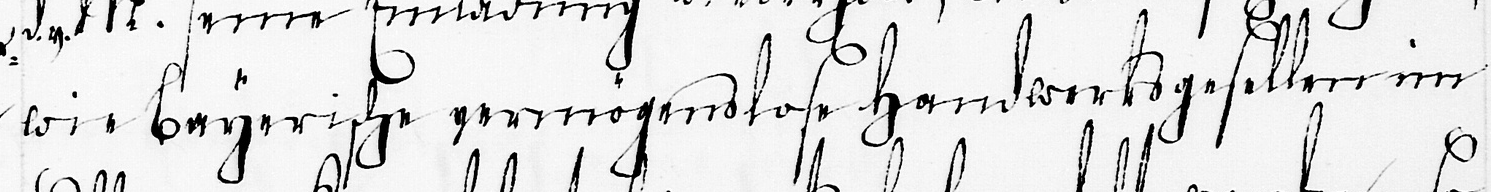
wie Bayerische vermögenslose Handwerksgesellen im
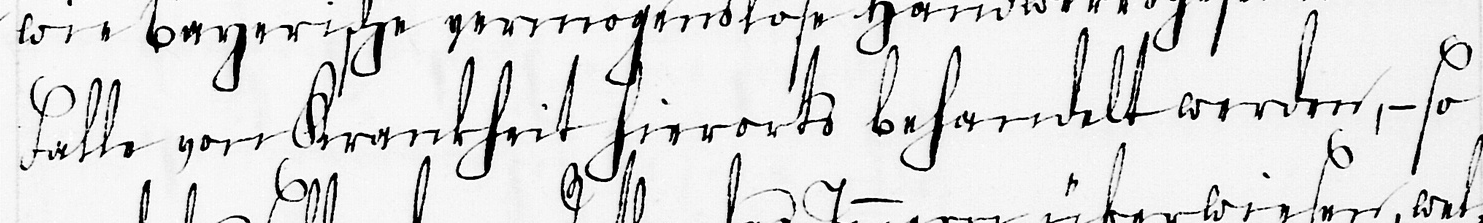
Falle von Krankheit hierorts behandelt werden, – so
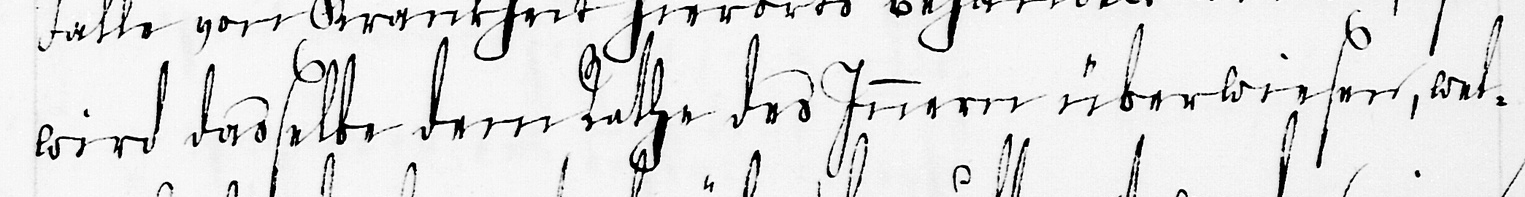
wird dasselbe dem Rathe des Innern überwiesen, wel¬
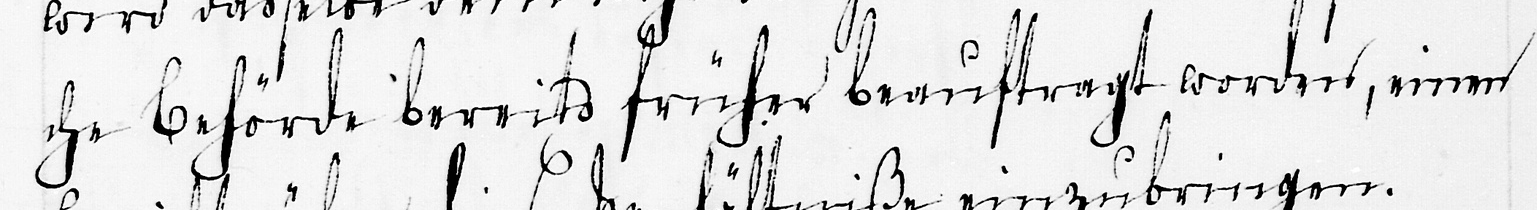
che Behörde bereits früher beauftragt worden, einen
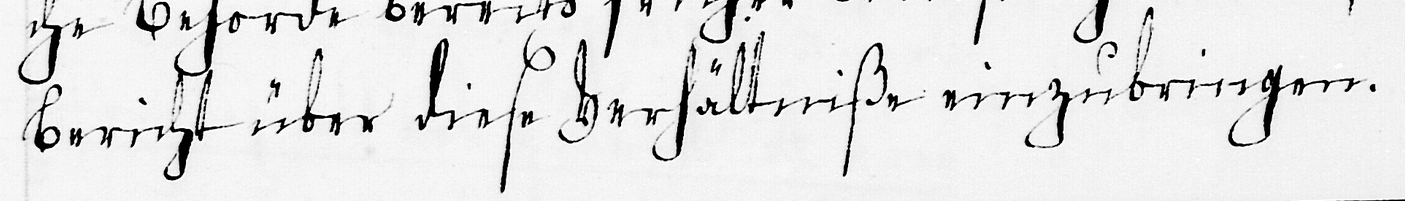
Bericht über diese Verhältniße einzubringen.
